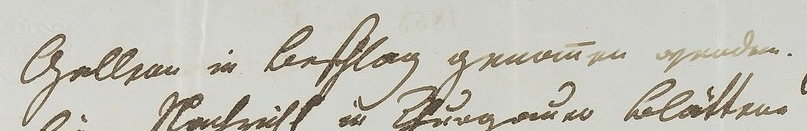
Gallern in Beschlag genommen werden.
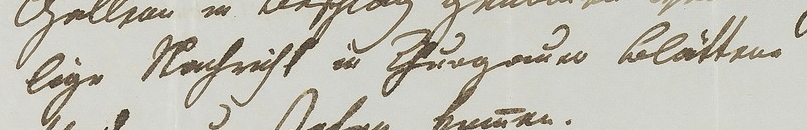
lige Nachricht in Thurgauer Blättern
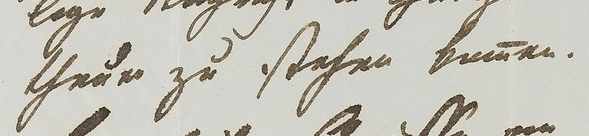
theuer zu stehen kommen.
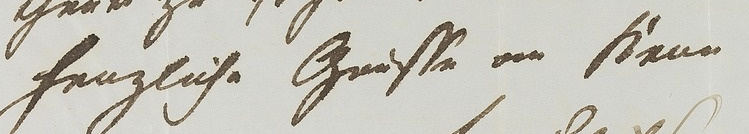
Herzliche Grüsse von Kern.
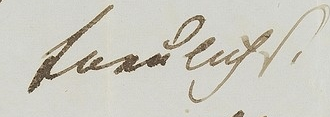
treulichst
